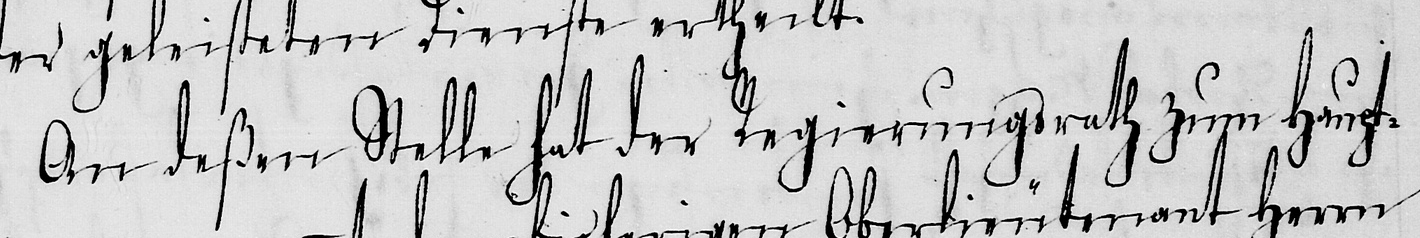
An deßen Stelle hat der Regierungsrath zum Haupt¬
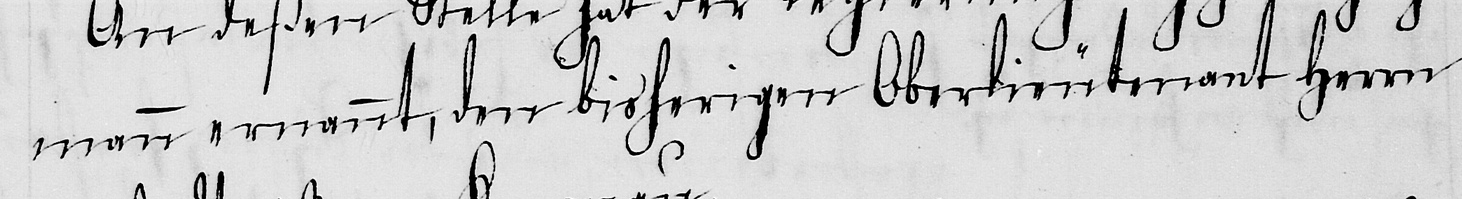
mann ernannt, den bisherigen Oberlieutenant Herrn
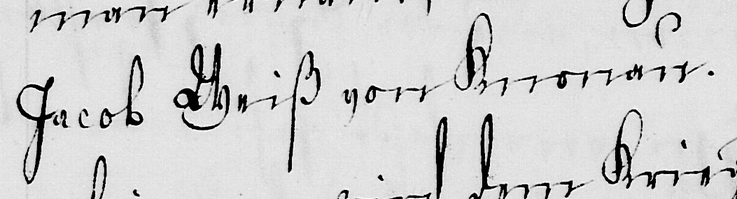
Jacob Weiß von Knonau.
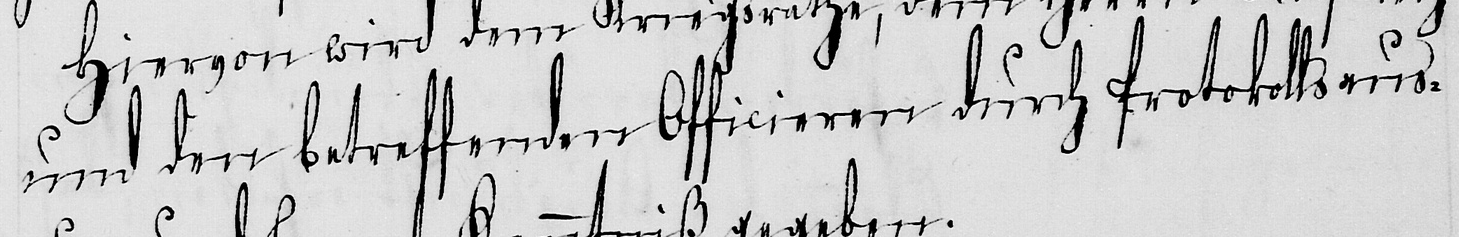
und den betreffenden Officieren durch Protokollsau¬
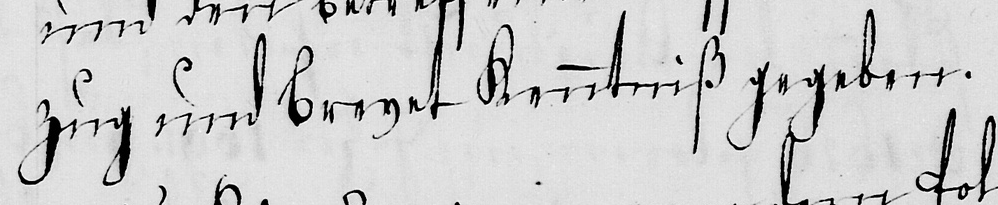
szug und Brevet Kenntniß gegeben.
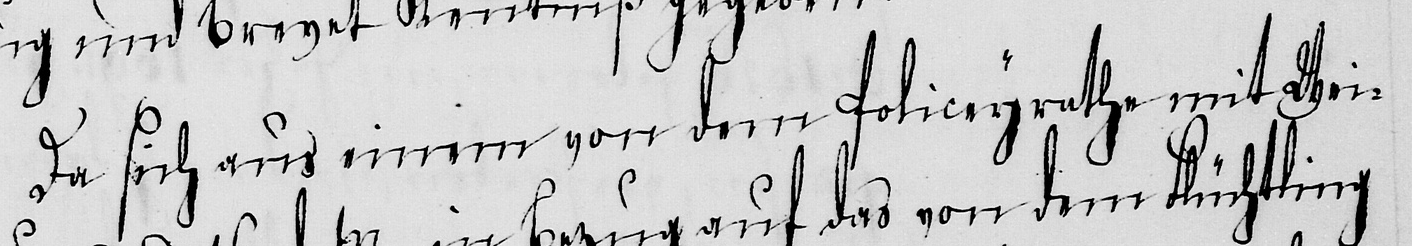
Da sich aus einem von dem Policeyrathe mit Weis¬
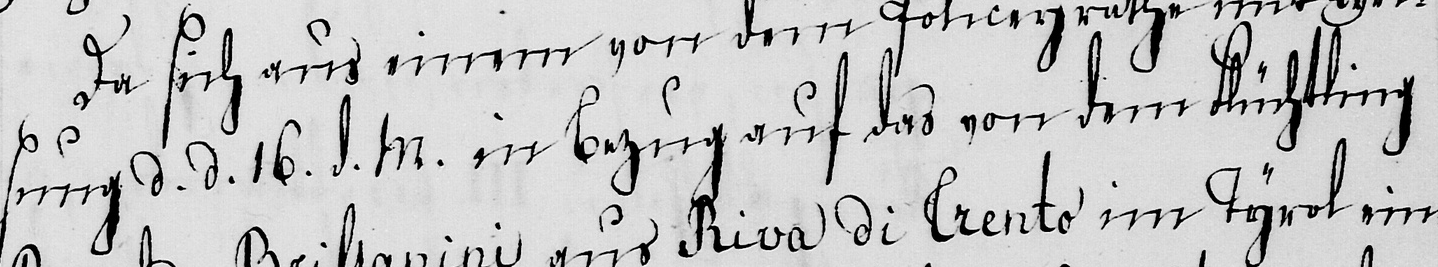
ung d. d. 16. d. M. in Bezug auf das von dem Flüchtling
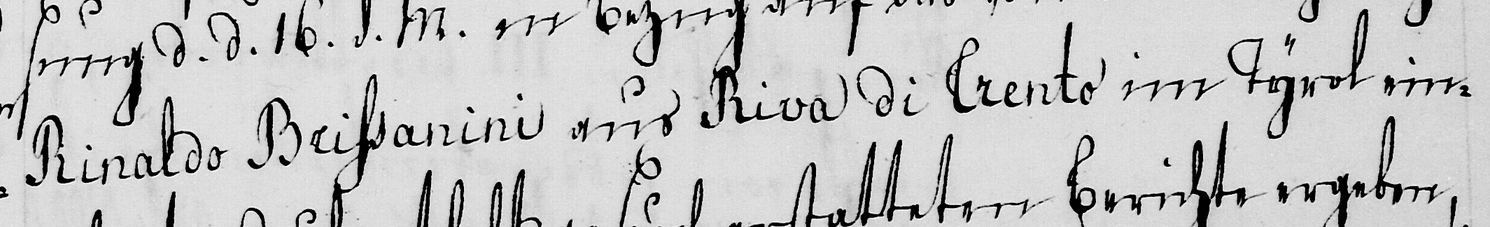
Rinaldo Brissanini aus Riva di Trento im Tyrol ein¬
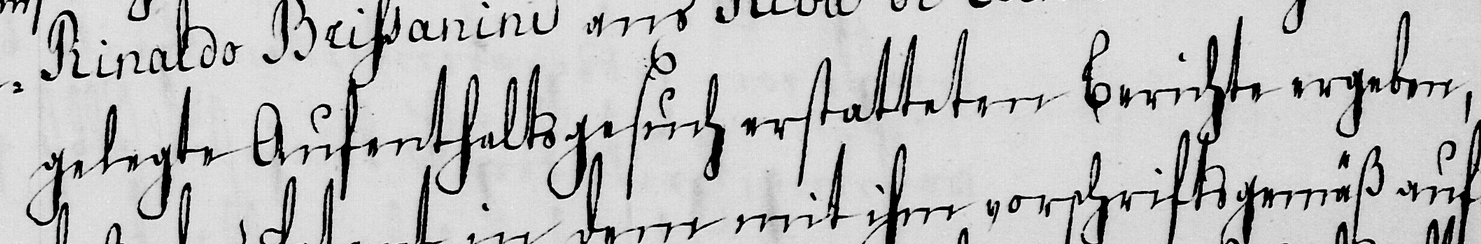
gelegte Aufenthaltsgesuch erstatteten Berichte ergeben,
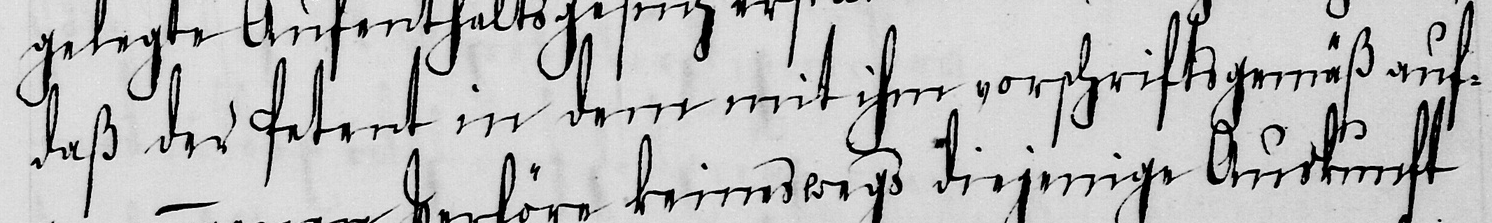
daß der Petent in dem mit ihm vorschriftsgemäß auf¬
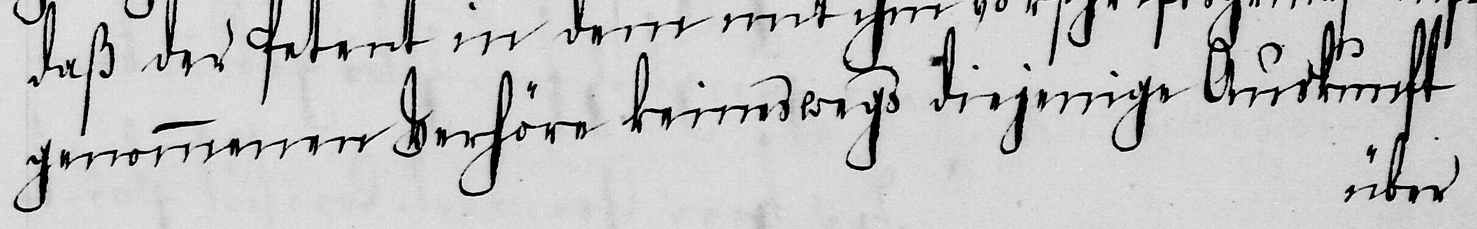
genommenen Verhöre keineswegs diejenige Auskunft
